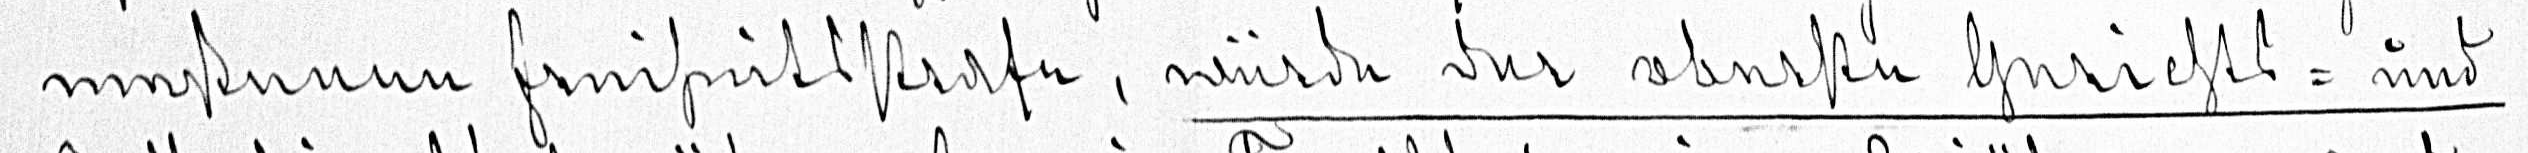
Freiheitsstrafe, würde der oberste Gerichts- und
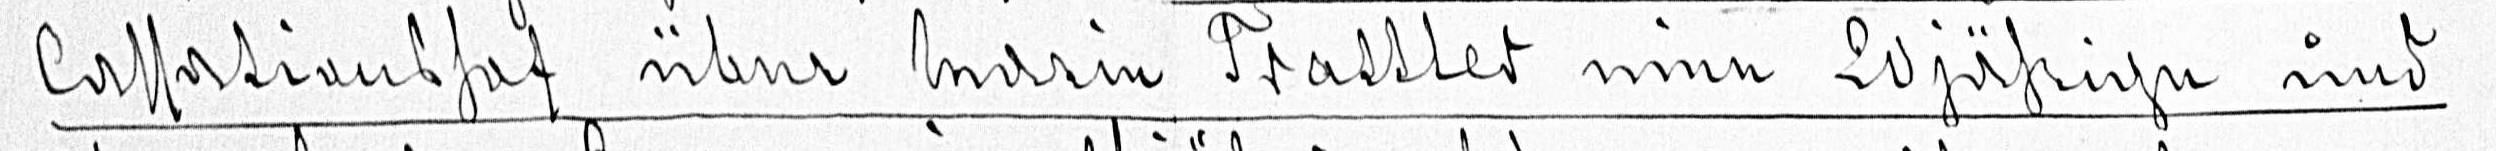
Cassatioshof über Marie Trattler eine 20jährige und
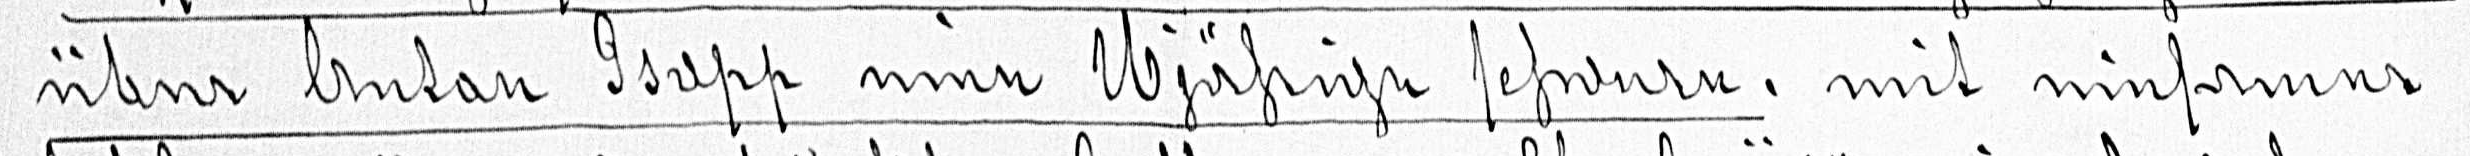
über Anton Isopp eine 16jährige schwere, mit einsamer
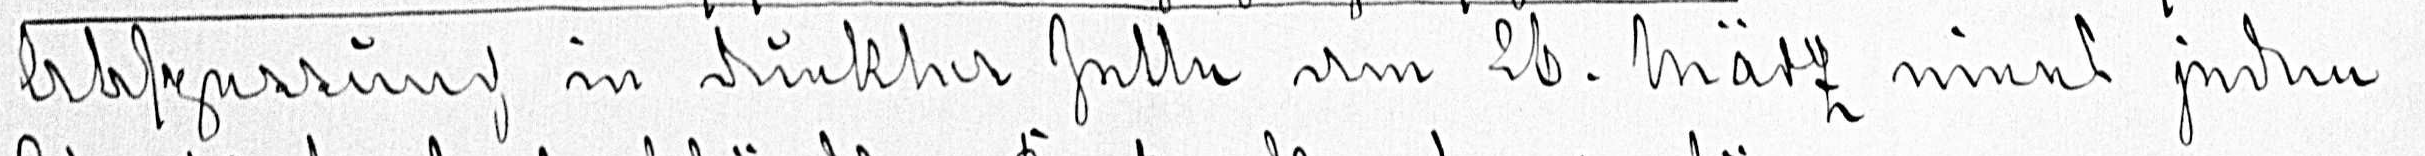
Absperrung in dunkler Zelle am 26. März eines jeden
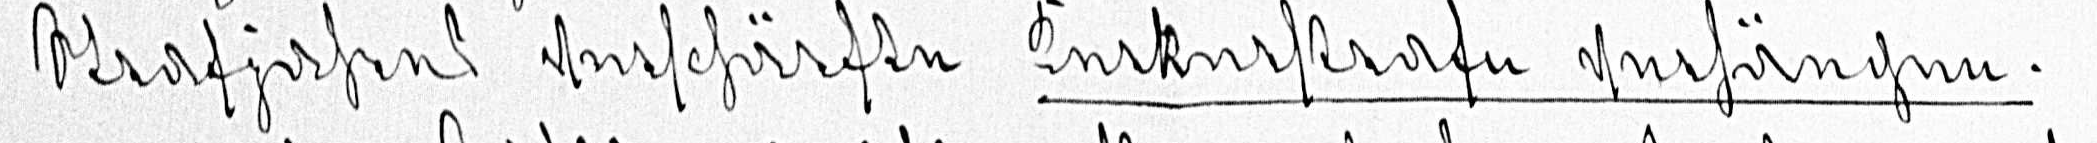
Strafjahres verschärften Kerkerstrafe verhängen.
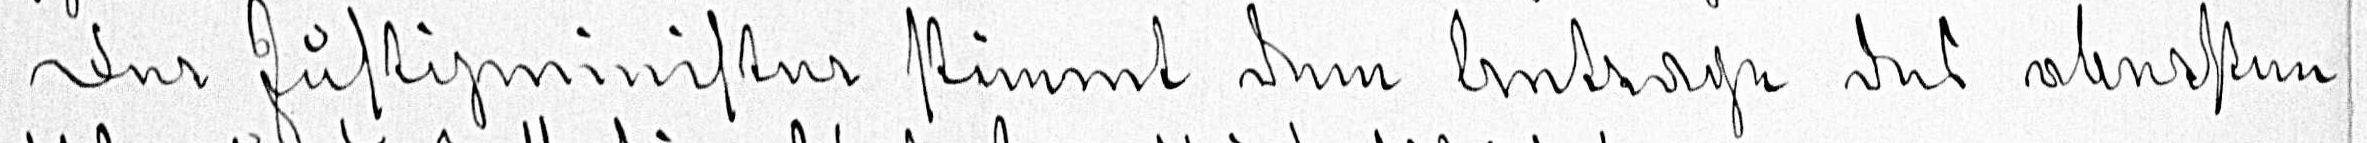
Der Justizminister stimmt dem Antrage des obersten
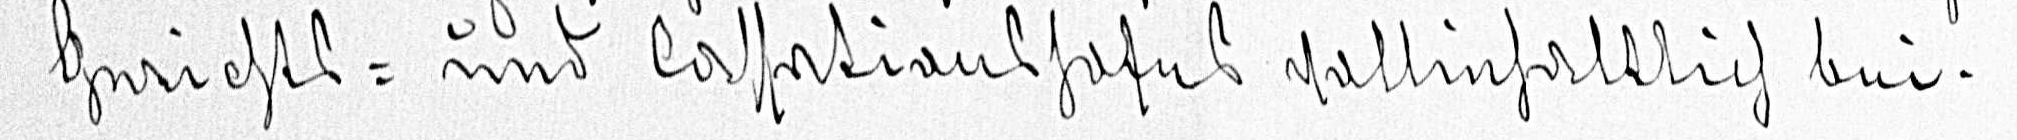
Gerichts- und Cassationshofes vollinhaltlich bei.
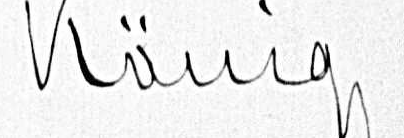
König
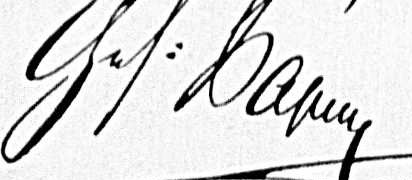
Ges. Papay
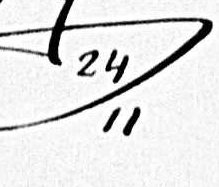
24/11
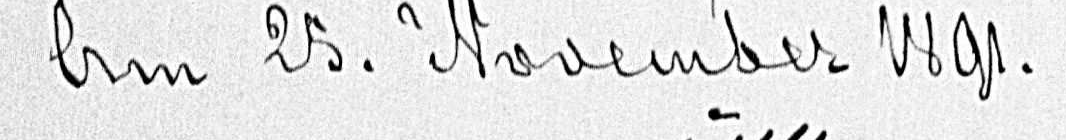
Am 25. November 1891
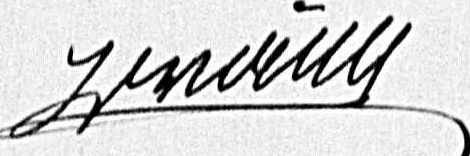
Braun
